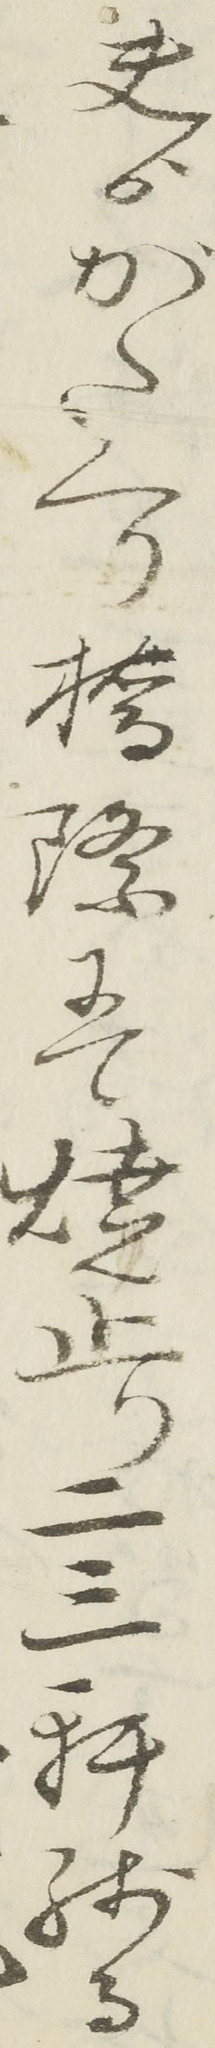夫ゟがたくり橋際にて焼止りニ三軒残る
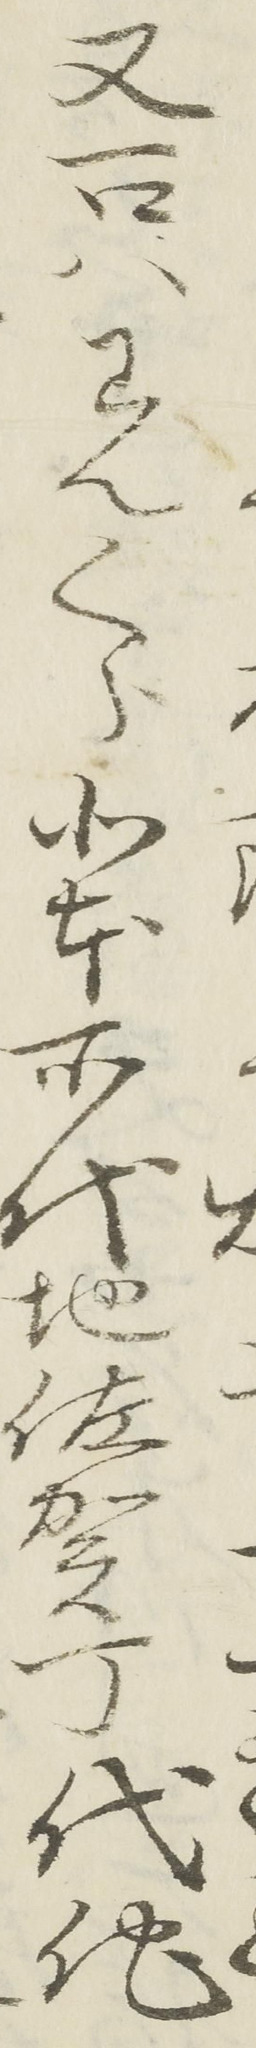又一口ハわんくら北本所代地佐賀丁代地
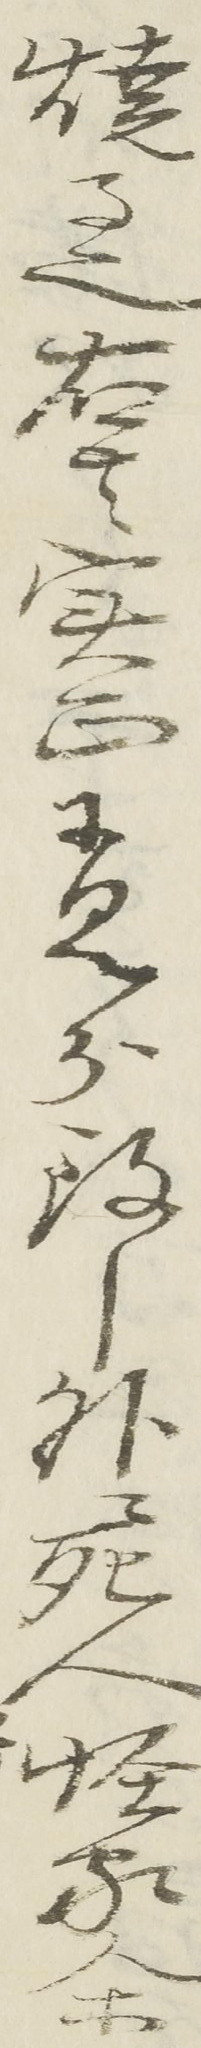焼る也右は実正に見分致し外ニ死人怪我人等
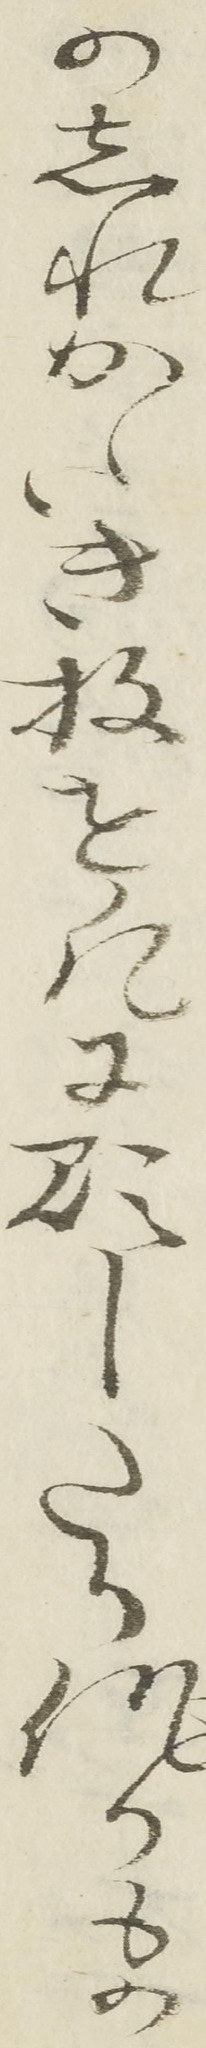のしれかたき数を凡に顕したり作りもの
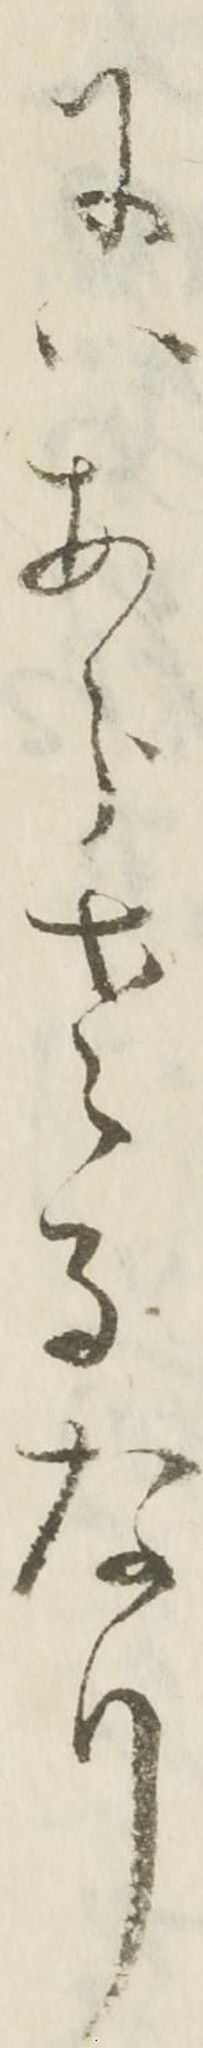にハあらさるなり
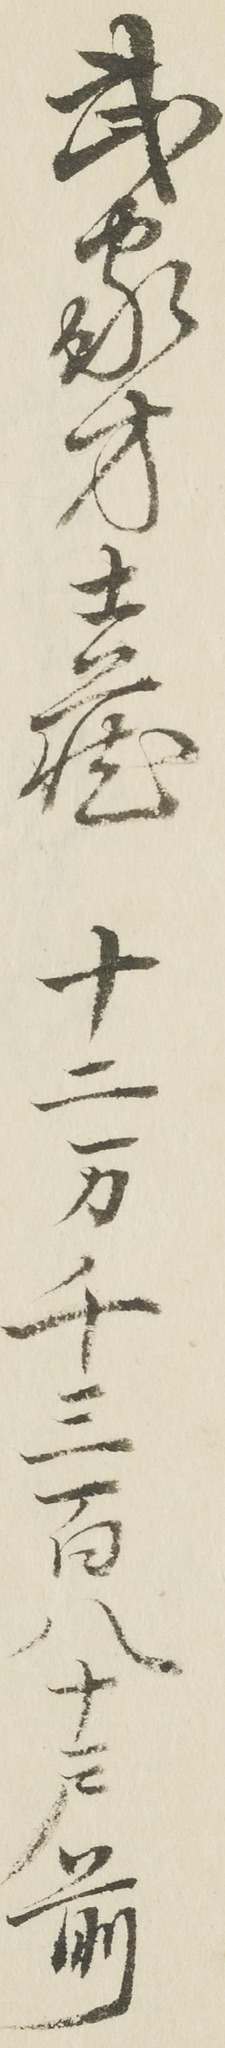武家方土蔵十二万千三百八十戸前
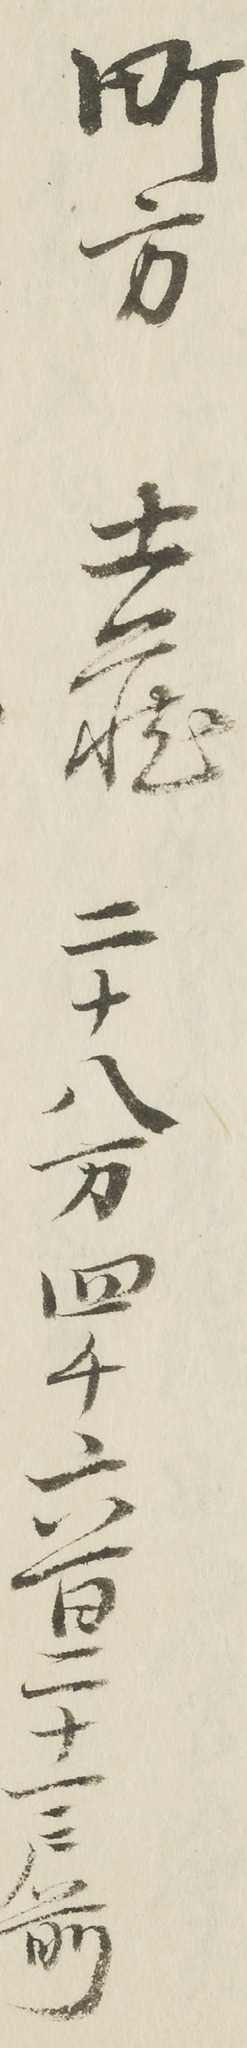町方土蔵二十八万四千六百二十一戸前
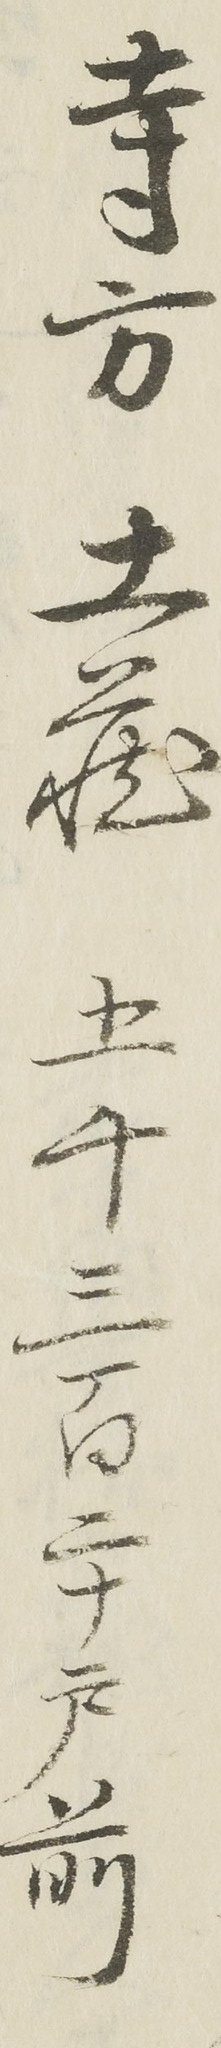寺方土蔵五千三百二十戸前
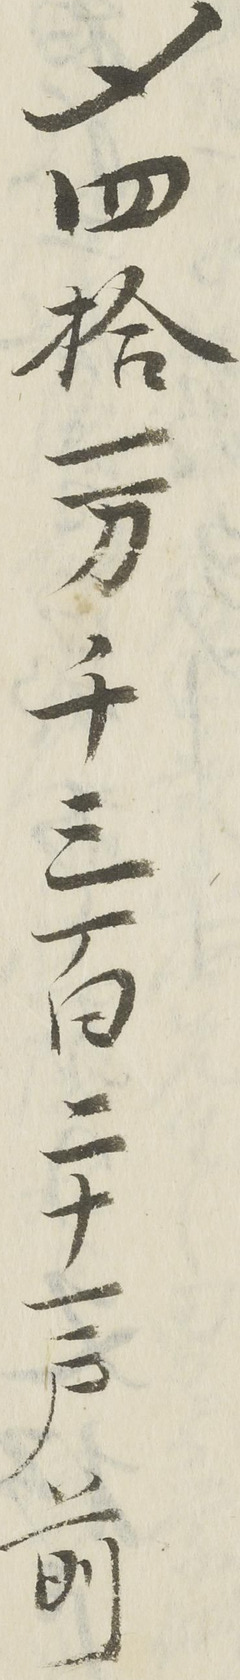〆四拾一万千三百二十一戸前
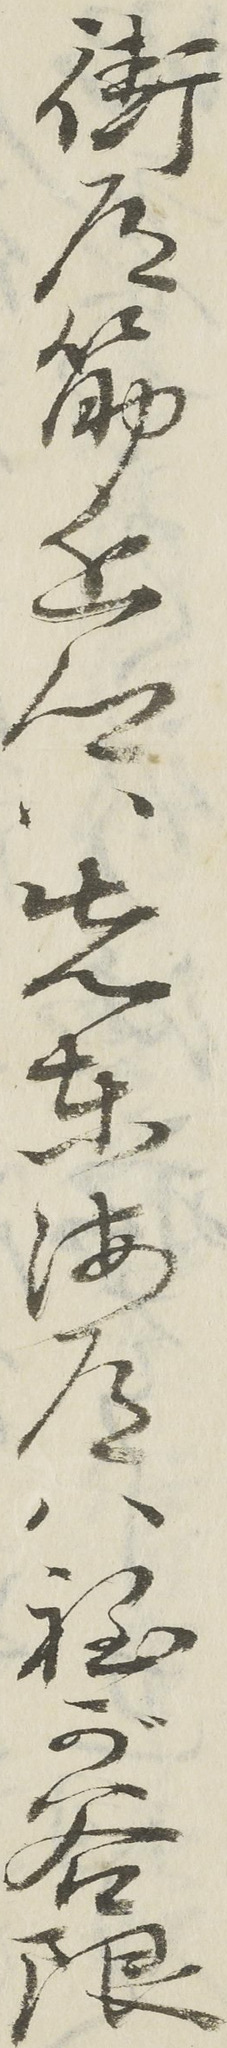街道筋近郷ハ先東海道ハ程が谷限
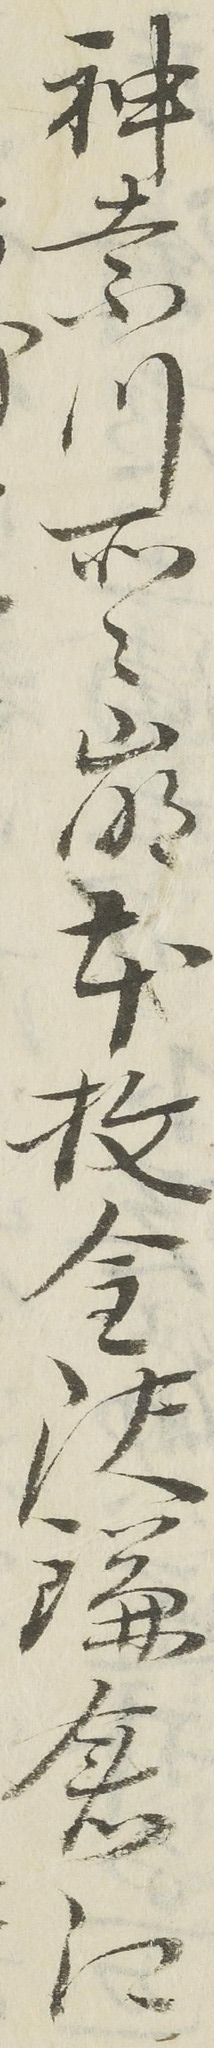神奈川所〻崩本牧金沢鎌倉江
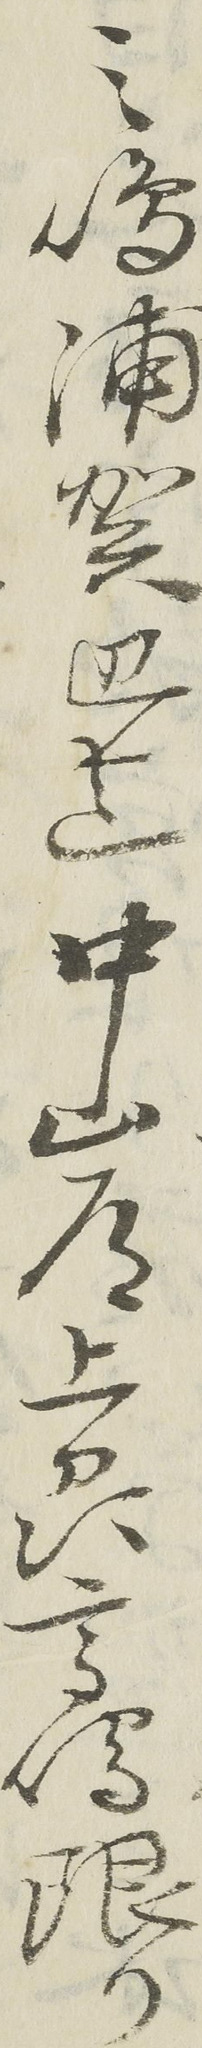之嶋浦賀辺迄中山道上州高傳限り
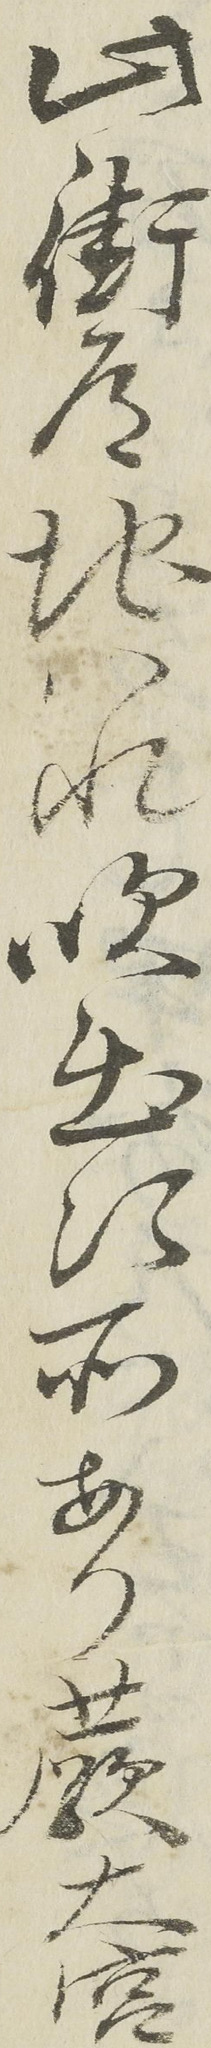此街道地ハれ吹出す所あり蕨大宮

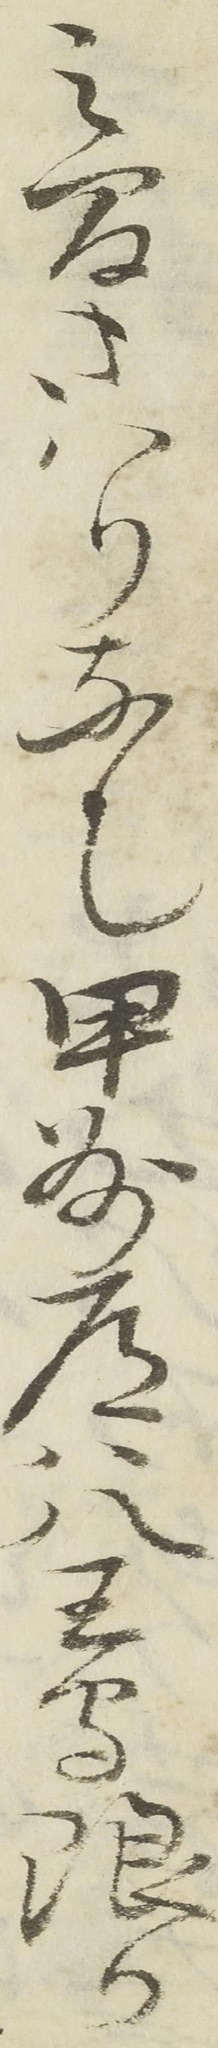之間さハりなし甲州道ハ八王寺限り
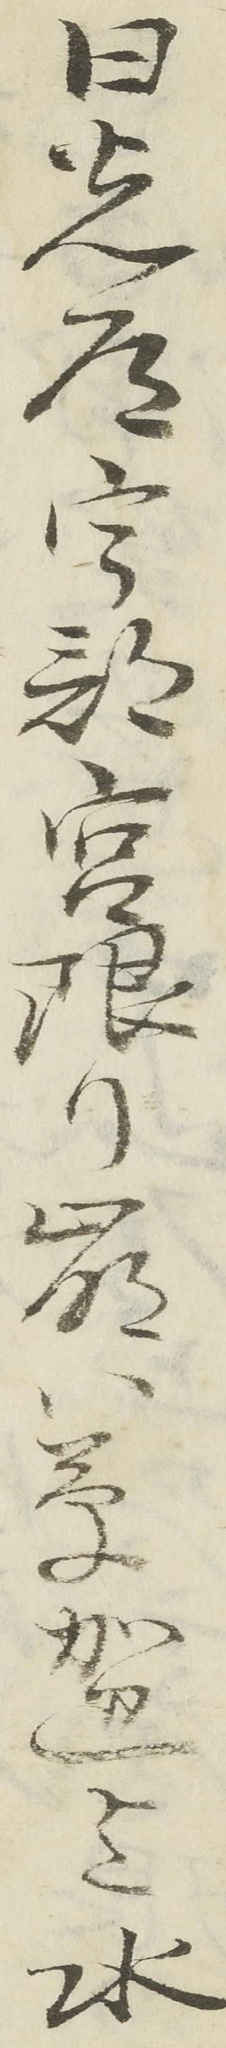日光道宇都宮限り崩ハ草加辺迄水
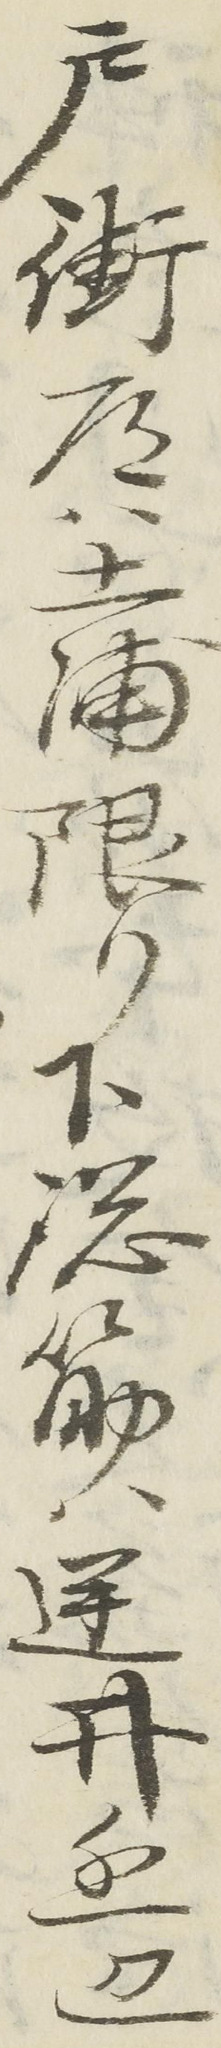戸街道ハ土浦限り下総筋ハ逆井近辺
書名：安政乙卯江戸大地震筆記　安政丙辰八月大阪大雷雨之記追加　安政三辰年七月松前辺大地震并八月大風雨記録
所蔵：東京大学地震研究所図書室 Earthquake Research Institute Library, The University of Tokyo, JAPAN
